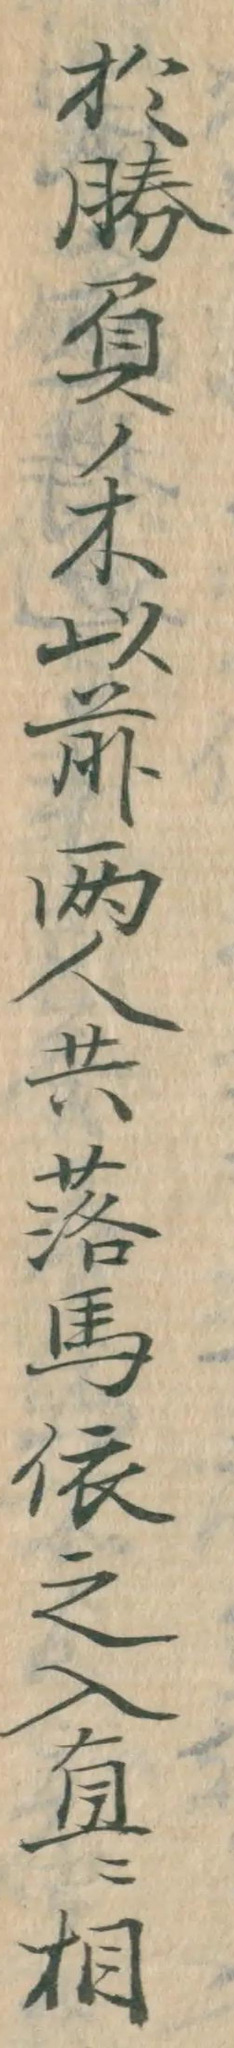於勝負ノ木以前両人共落馬依之入直ニ相

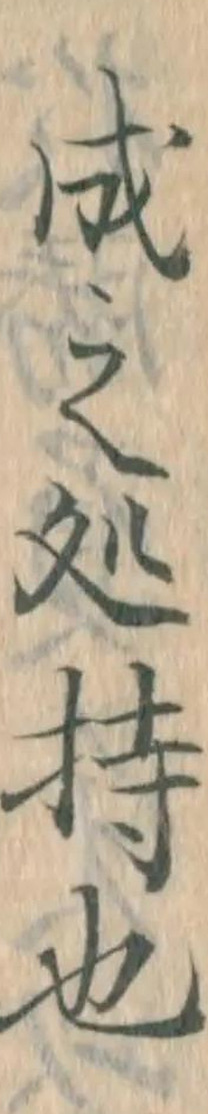成之処持也
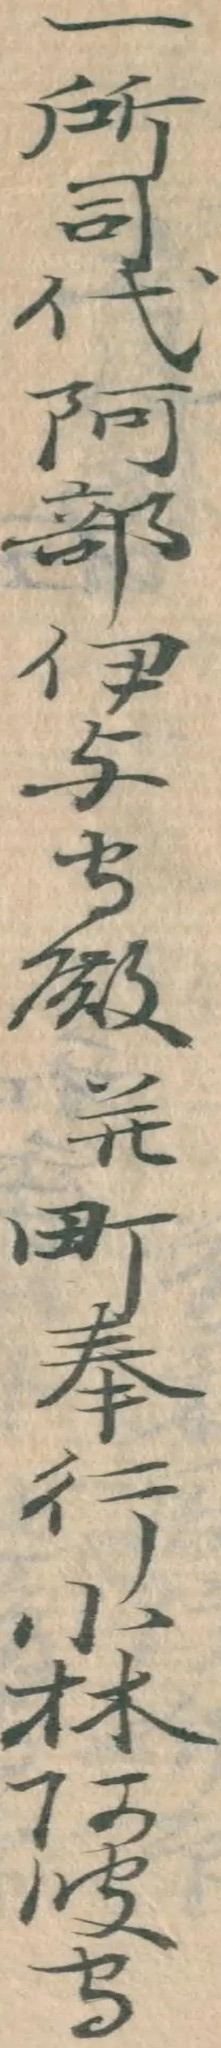一所司代阿部伊与守殿并町奉行小林阿波守
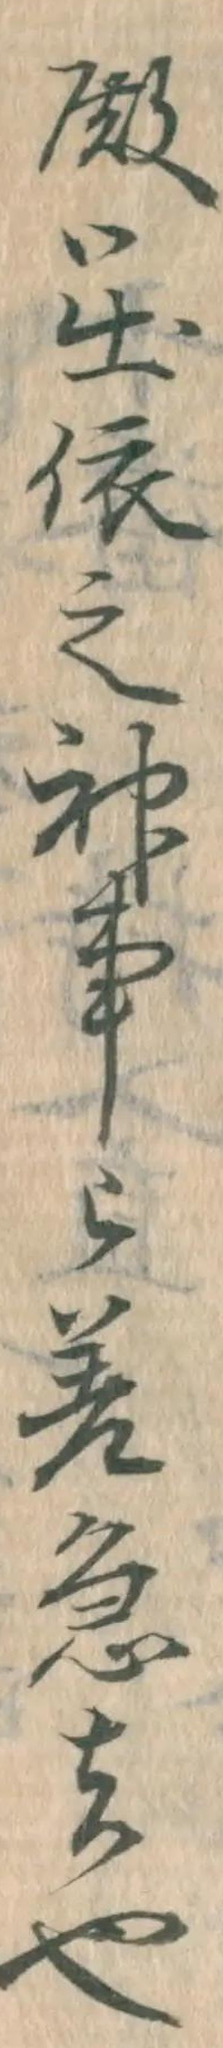殿御出依之神事被差急者也
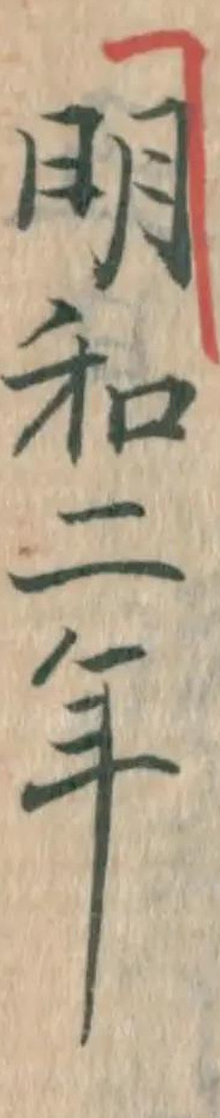明和二年
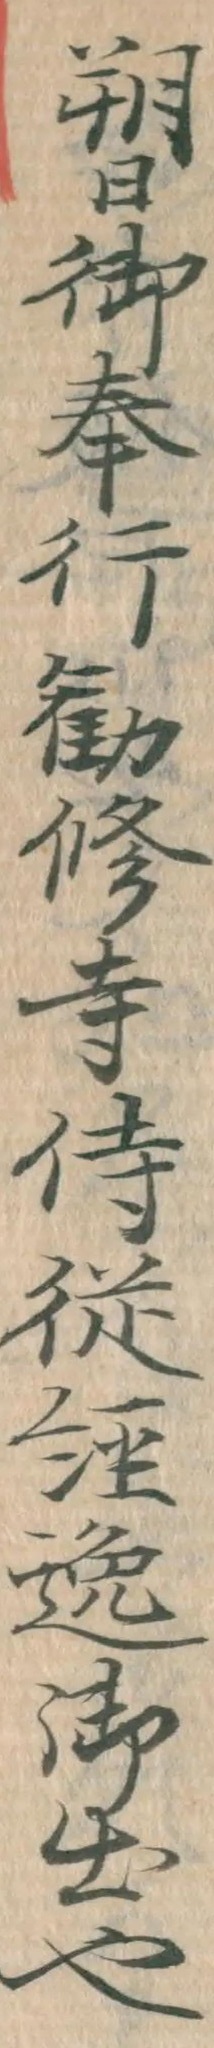朔日御奉行勧修寺侍従経逸御出也
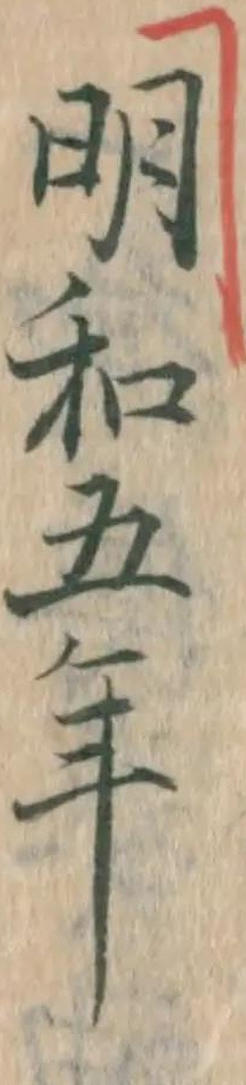明和五年
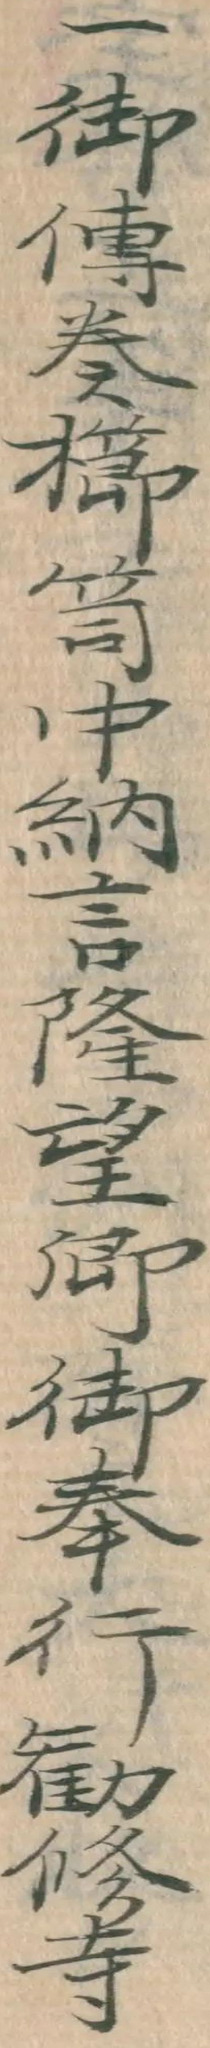一御伝奏櫛笥中納言隆望卿御奉行勧修寺
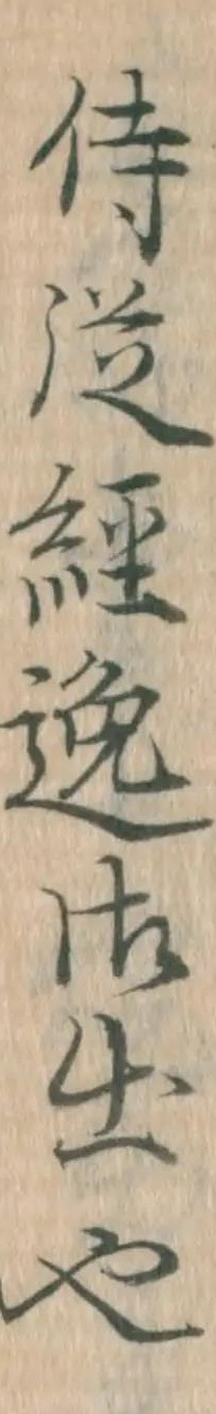侍従経逸御出也
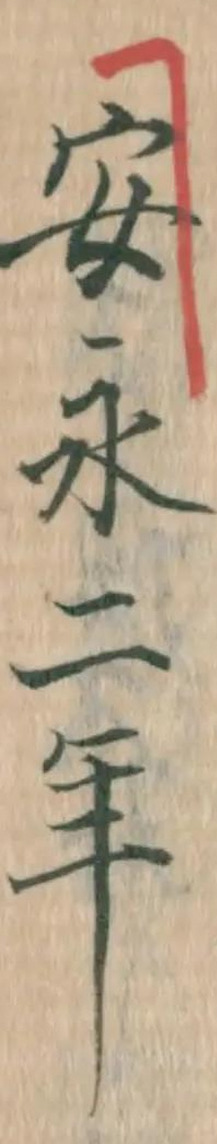安永二年
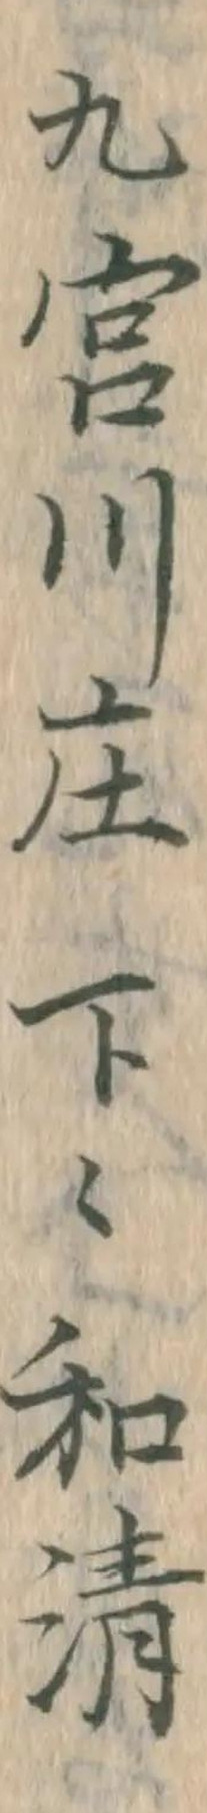九宮川庄下々和清
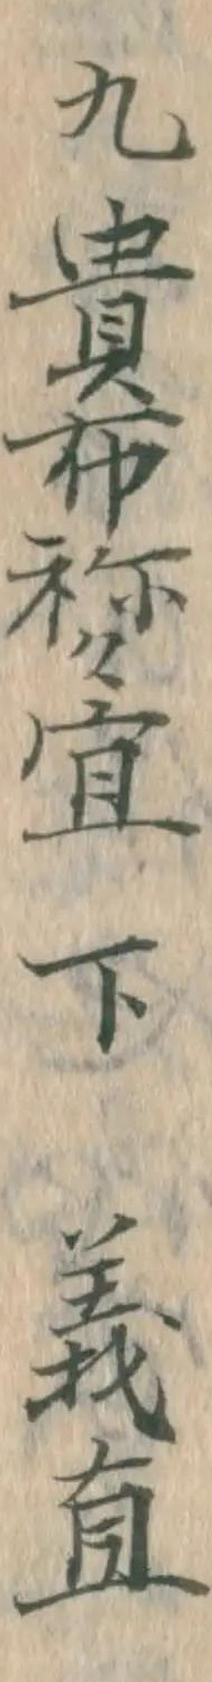九貴布祢々宜下義直
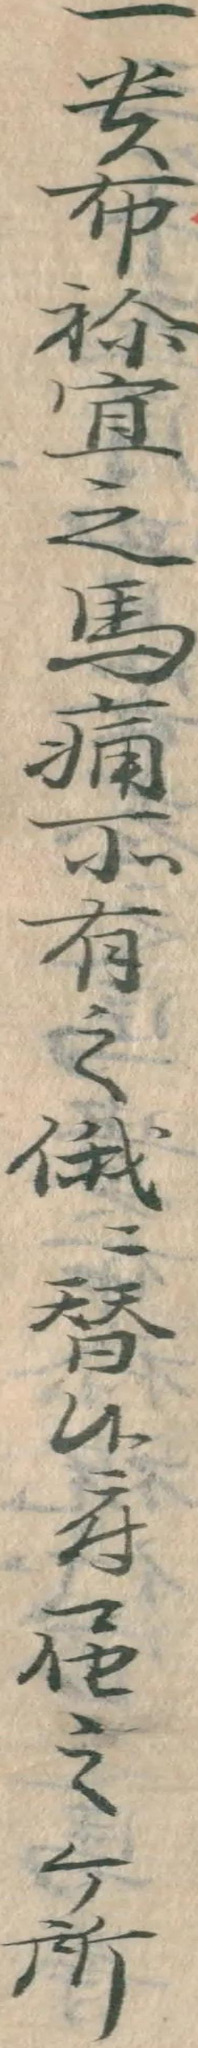一貴布祢宜之馬痛所有之俄ニ替候ニ付届之ケ所
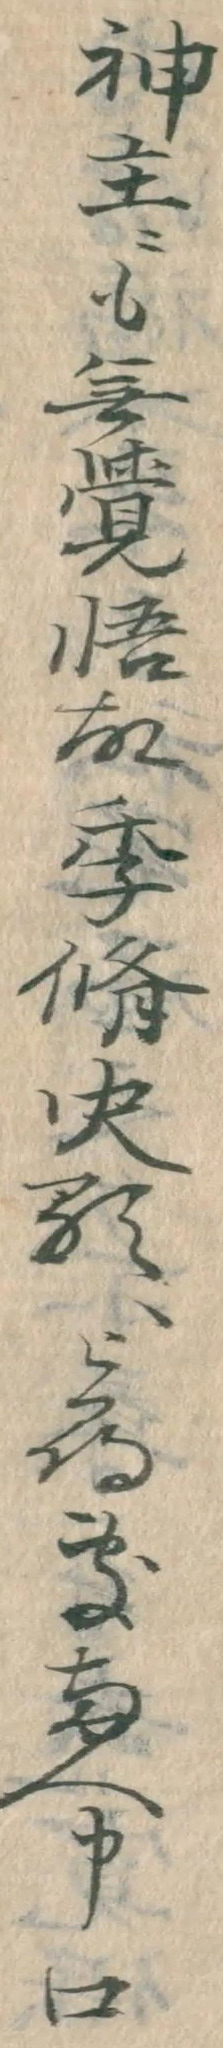神主ニも無覚悟故季修史顕へ被尋処両人申口
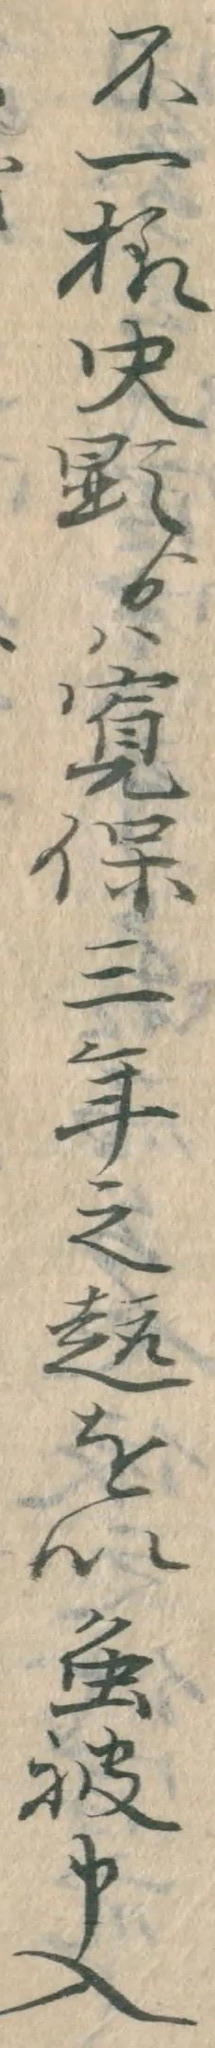不一様史顕ゟハ寛保三年之趣を以雖被申入
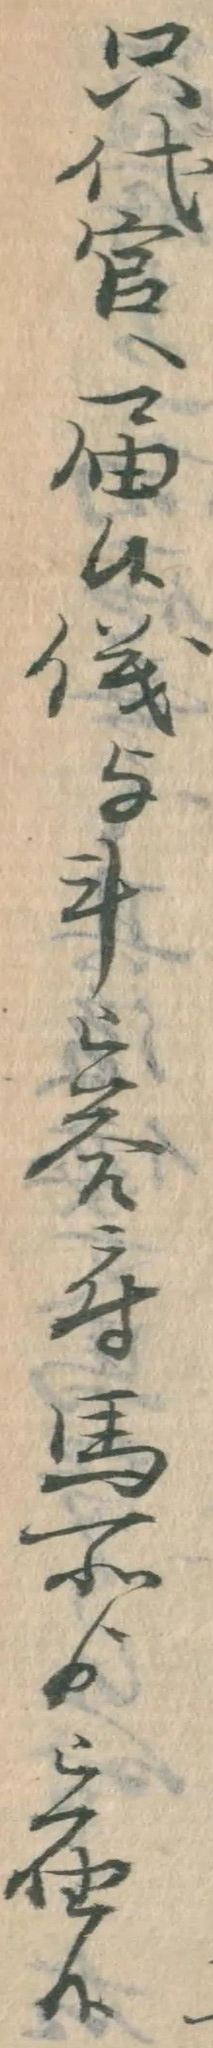只代官へ届候儀与計被答ニ付馬所ゟ被届候
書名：賀茂社記録. 第10冊
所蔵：国立国会図書館 National Diet Library, JAPAN
